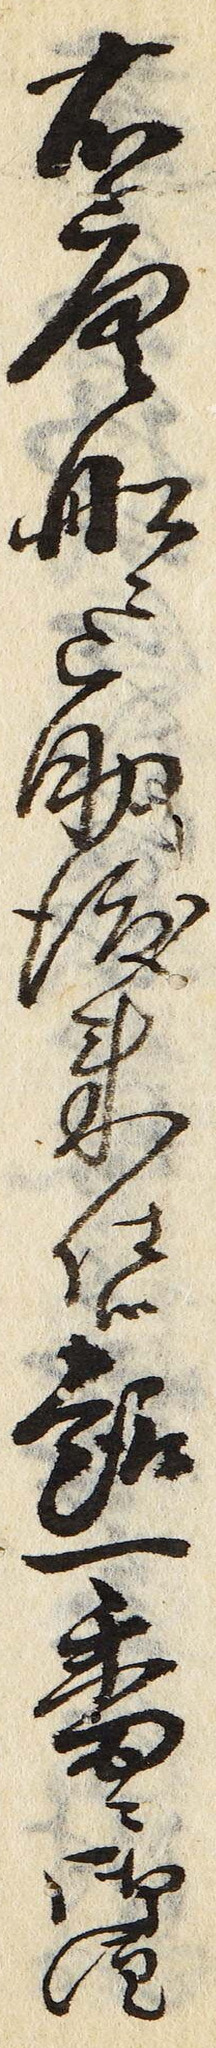右唐船ニ被助渡来仕候趣一番ニ御注
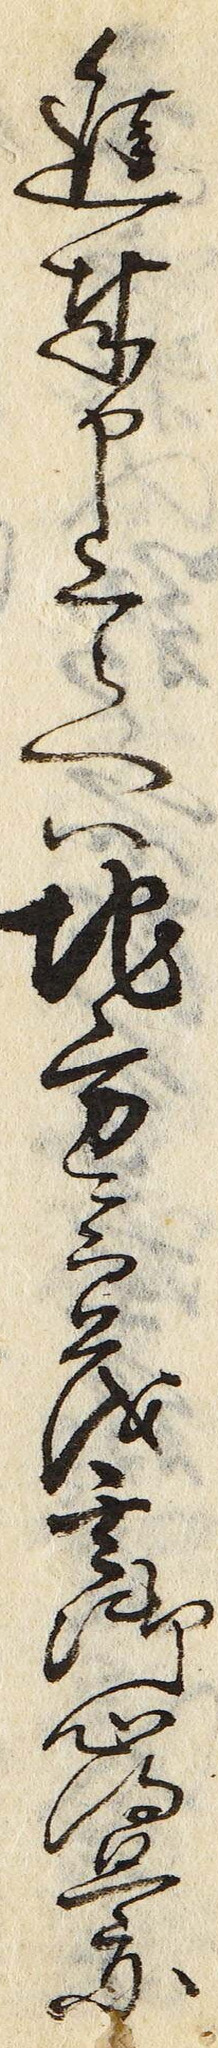進奉申上候ヘハ地方ニ而も其御心得且亦
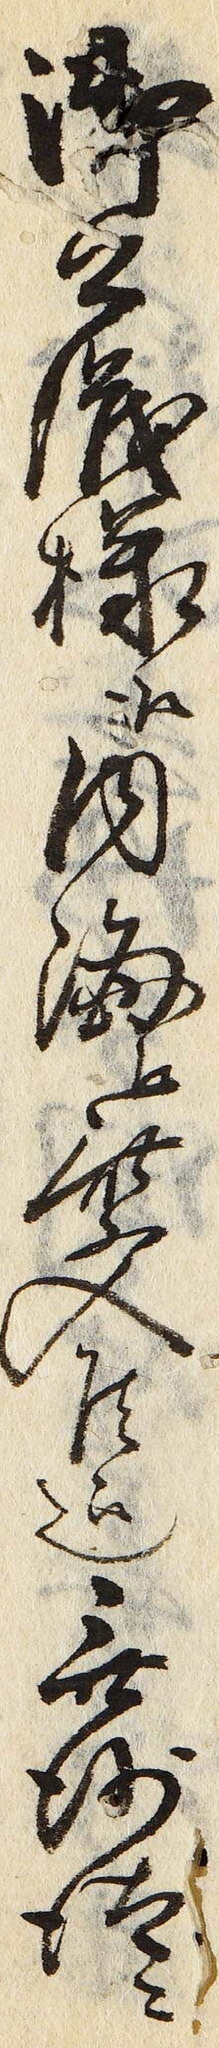御公儀様江内海江乗入候迄無沙汰ニ
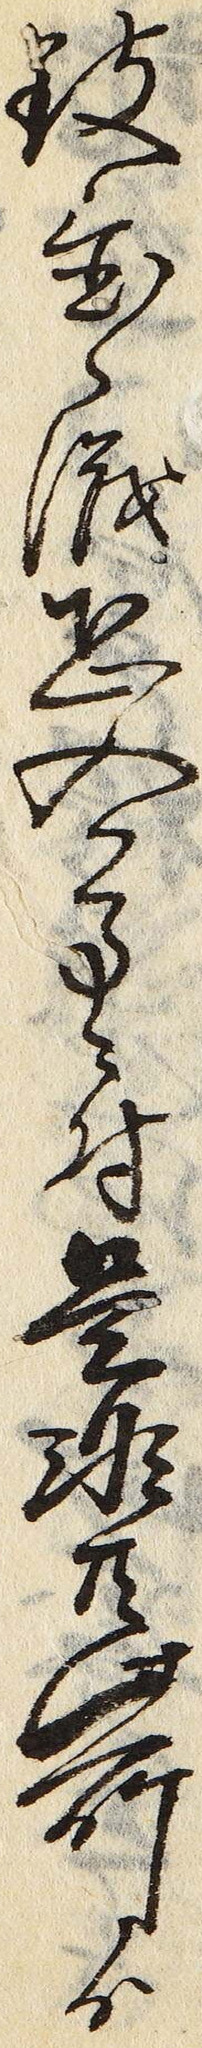致置候儀恐入候事ニ付是非共此所ゟ
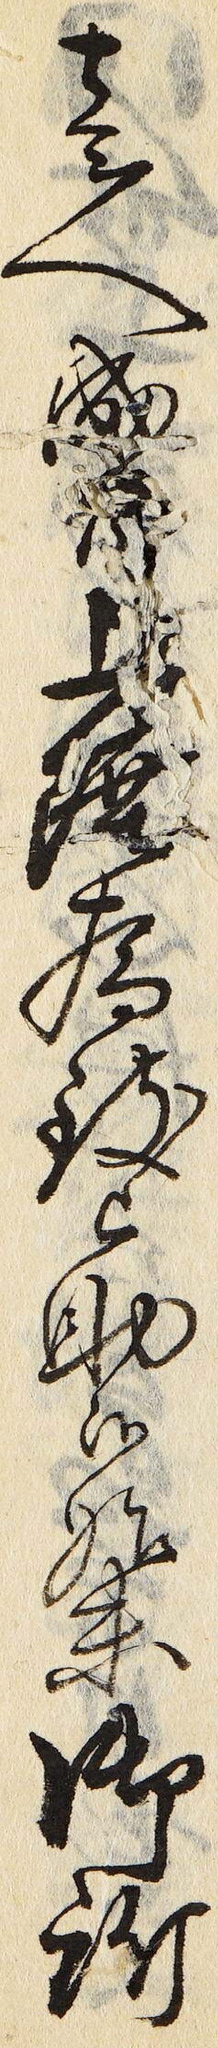壱人成共上陸為致被助候始末御訴
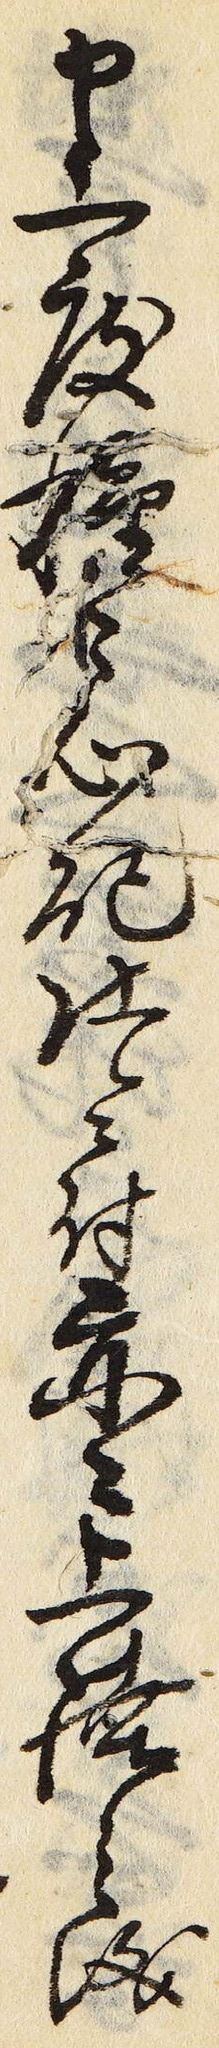申上度々心配仕候ニ付亦々上陸之儀
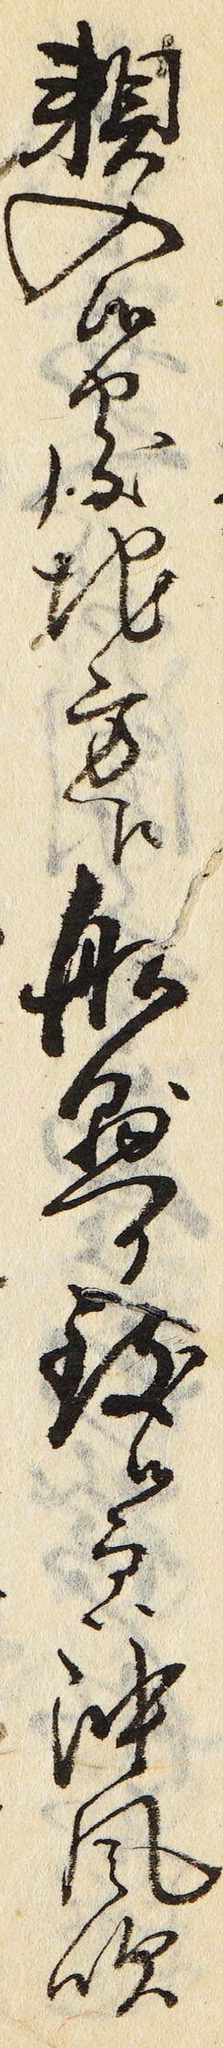頼入候処地方え船懸り致候而ハ沖風吹
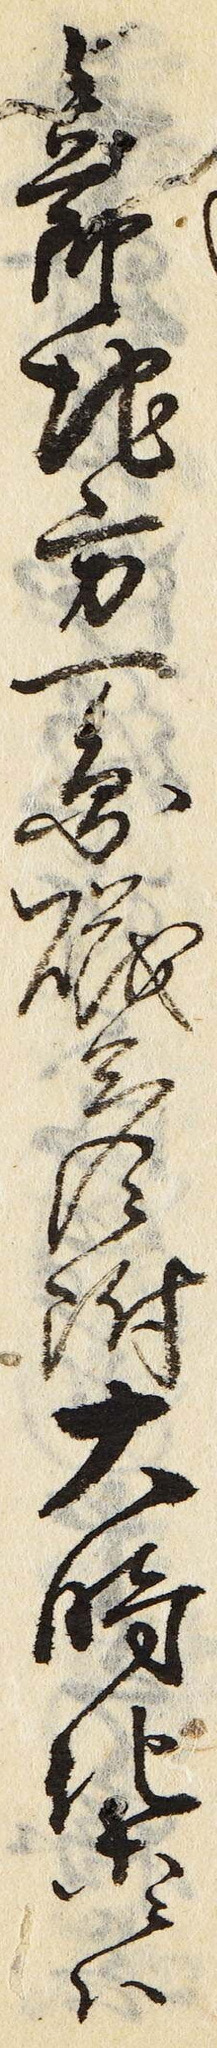候節地方一円磯多ニ付大時化等ニハ
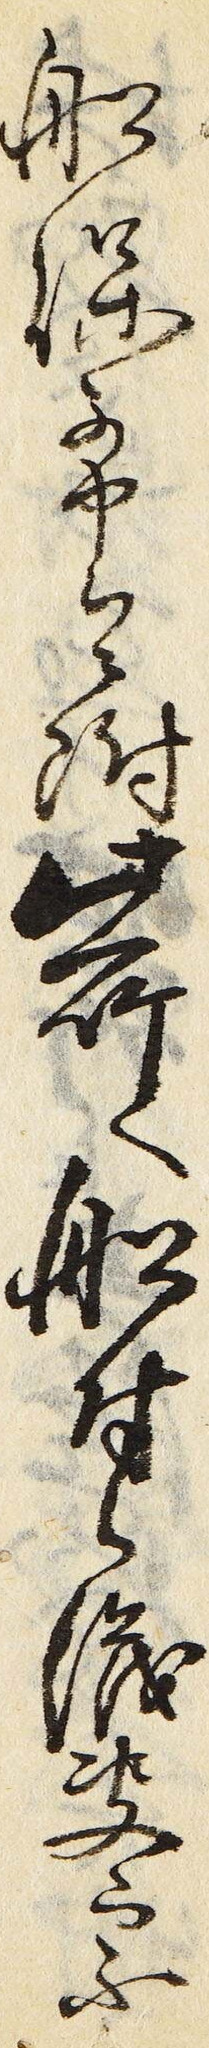船保不申候ニ付此所へ船付候儀決而不
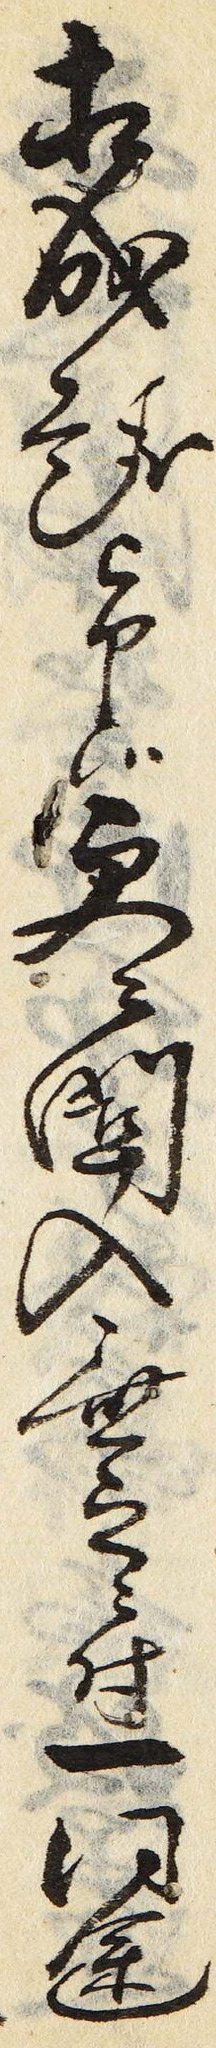相成趣被申候更ニ聞入無之ニ付一同途
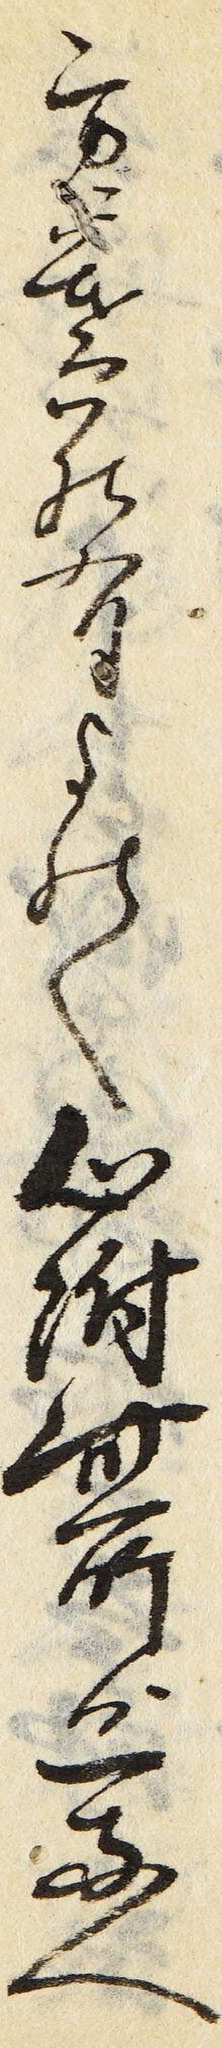方ニ暮罷有よの〳〵？心付此所ゟ一両人
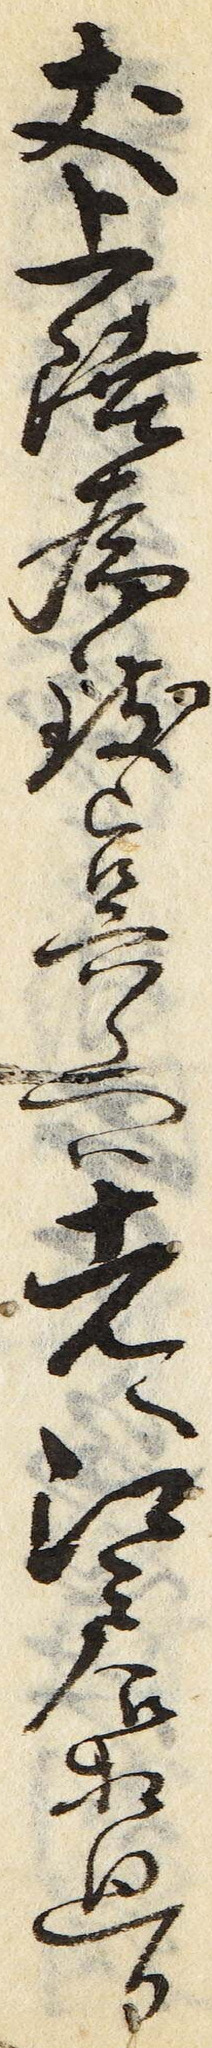丈上陸為致被呉候ヘハ先へ江戸え相廻り
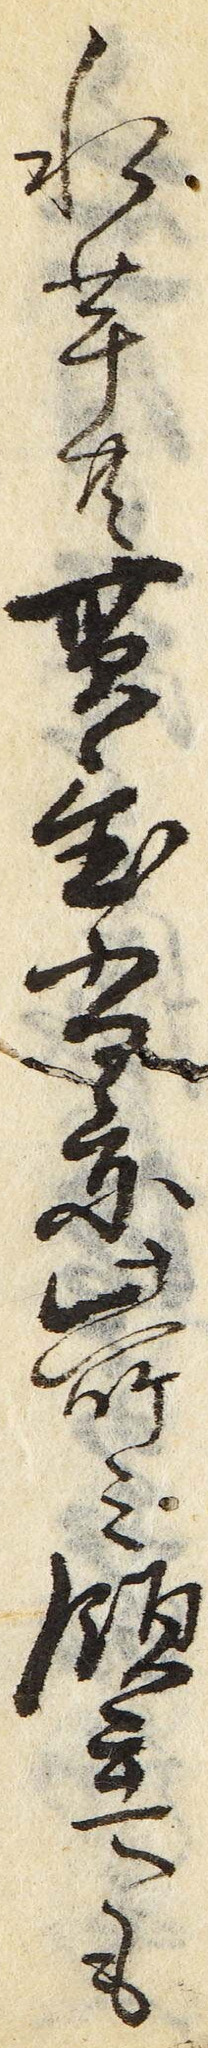水芋共貰置尚亦此所之領主へも
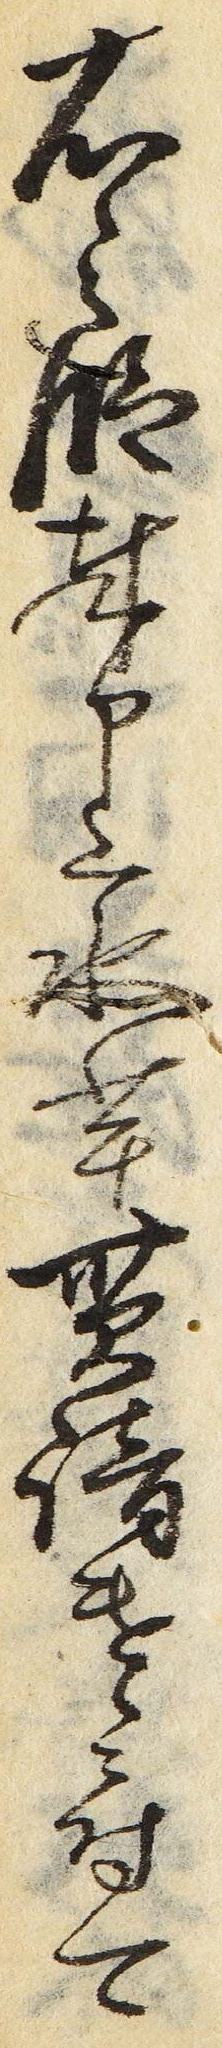右之段奉申上水芋貰請遣候ニ付可

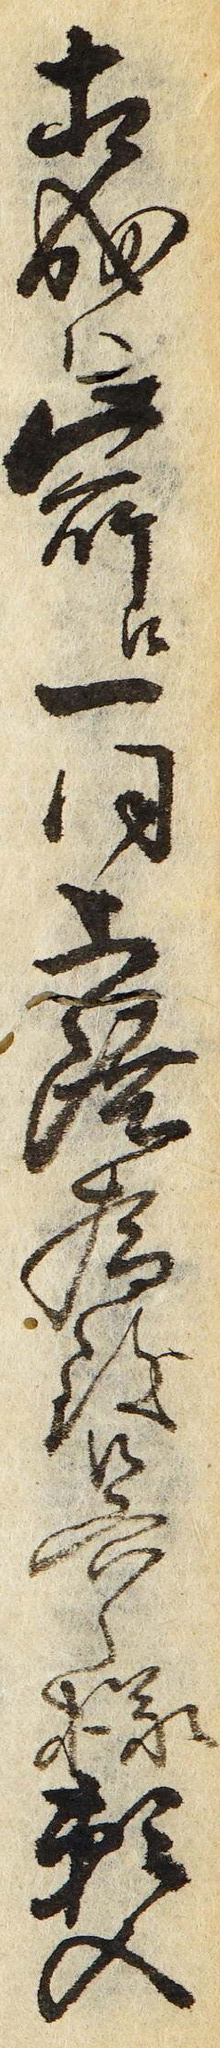相成ハ此所え一同上陸為致呉候様頼入
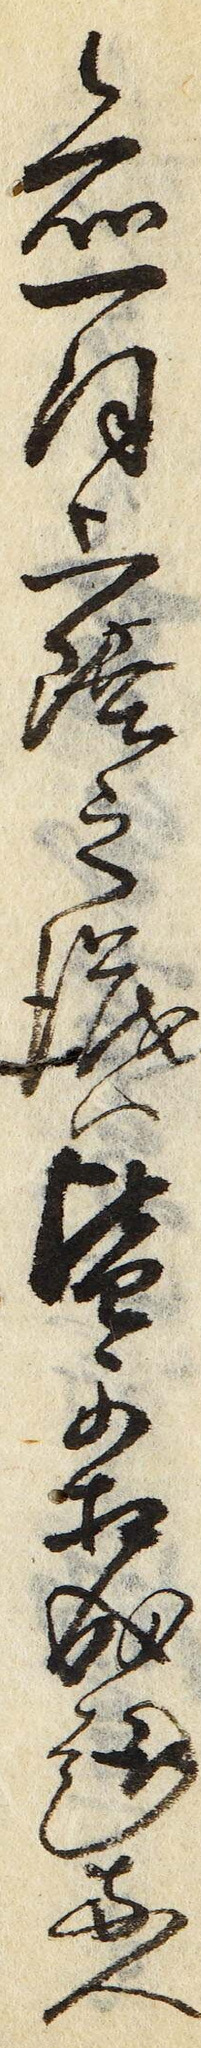候所一同上陸之儀ハ皆不相成趣両人
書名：阿波幸宝丸漂流記
